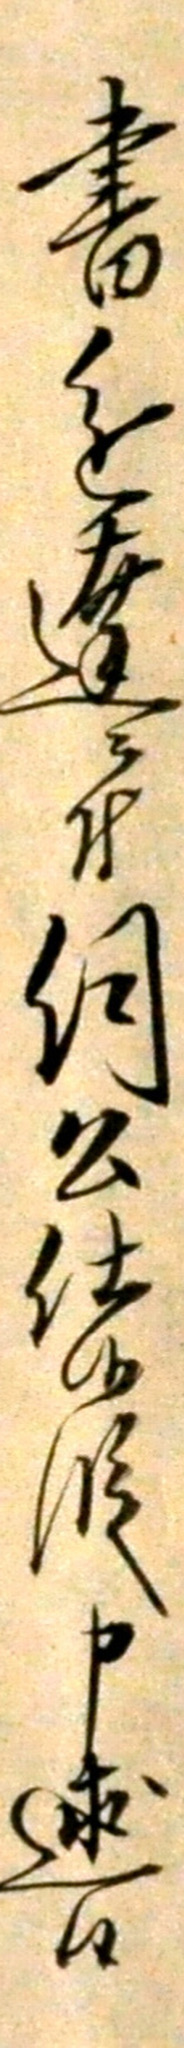書進達ニ付伺公仕候段申述候
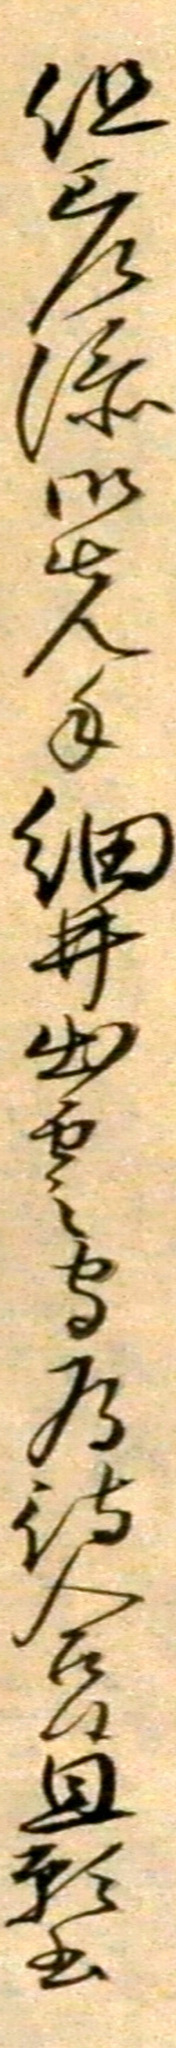但差添御先手細井出雲守為待合候且願書
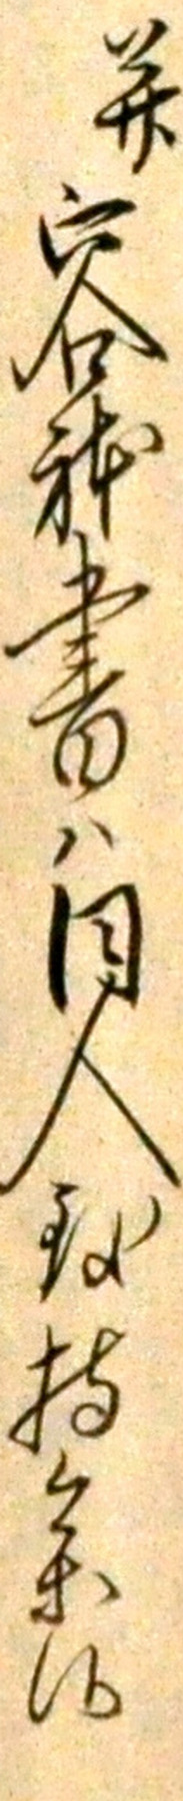并容躰書ハ同人致持参候
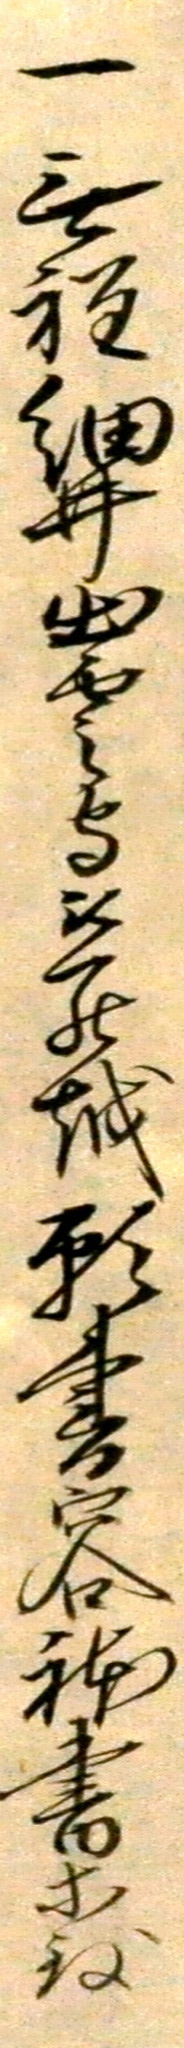一無程細井出雲守被罷越願書容躰書等致
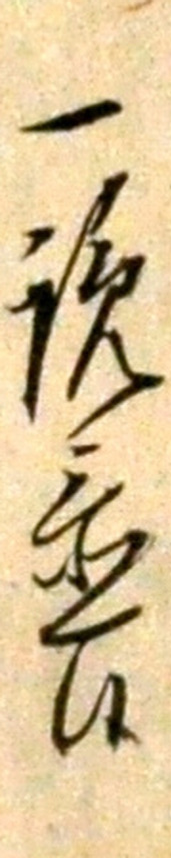一覧置候
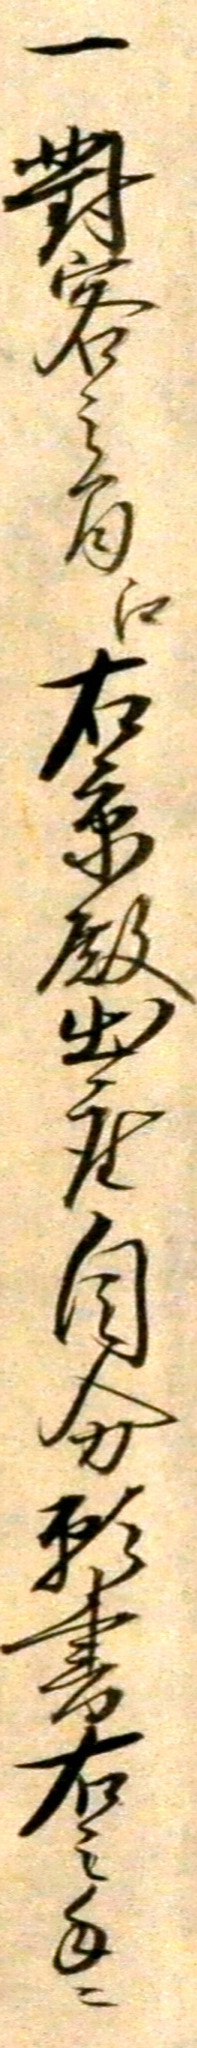一対客之間え右京殿出座自分願書右之手ニ
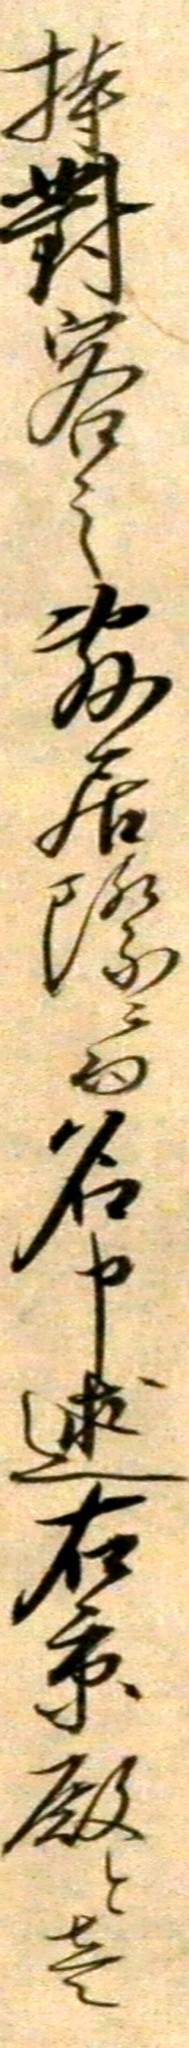持対客之敷居際ニ而名申述右京殿と壱

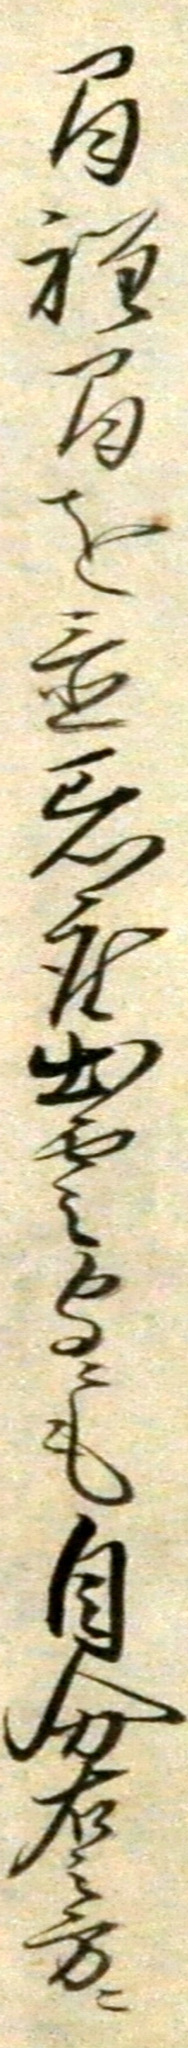間程間を置着座出雲守ニも自分右之方ニ
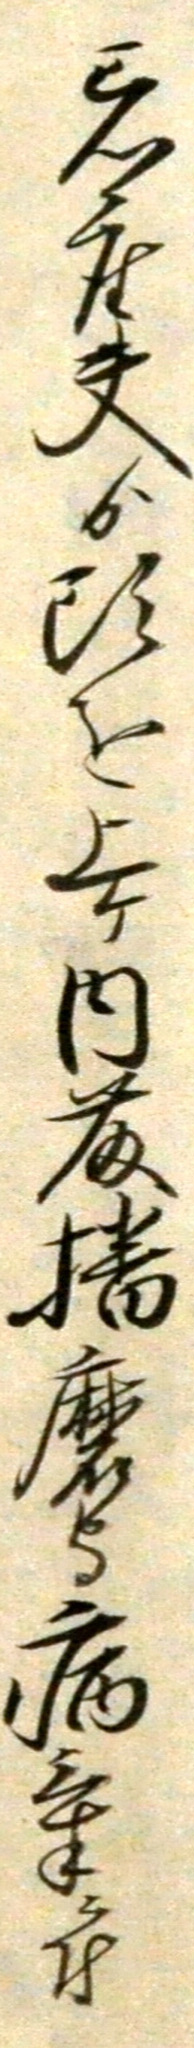着座夫ゟ頭を上ケ内藤播磨守病気ニ付
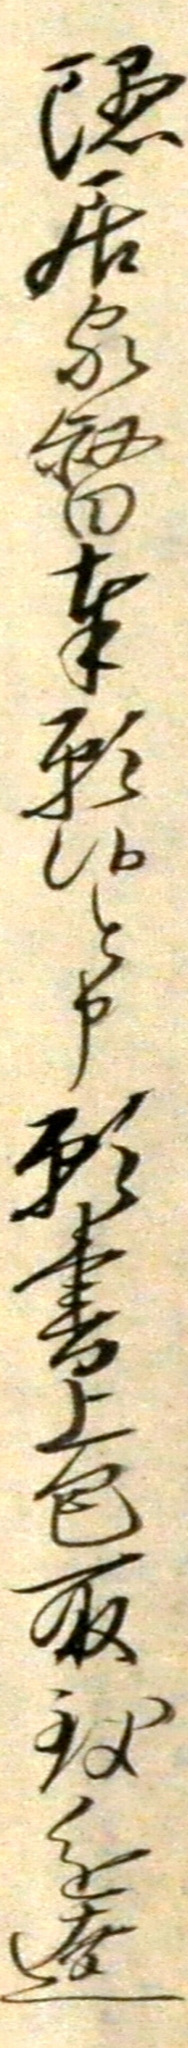隠居家督奉願候と申願書上包取致進達
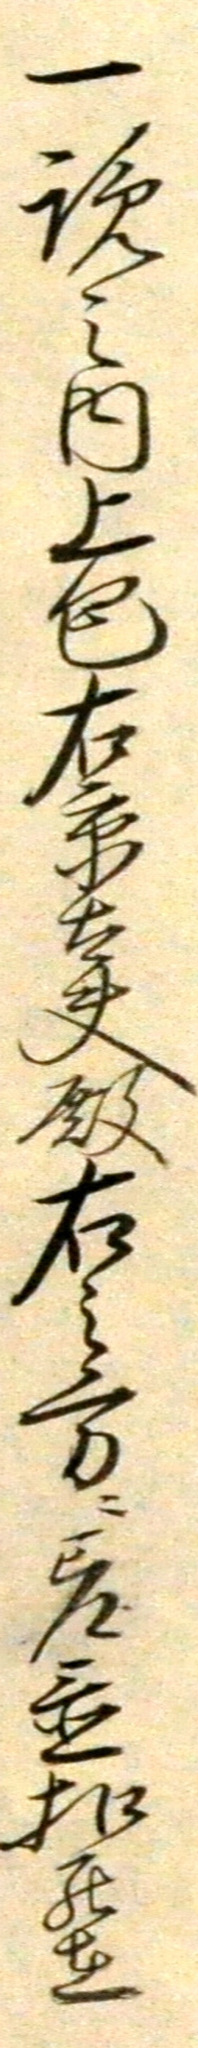一覧之内上包右京大夫殿右之方ニ差置扣罷在
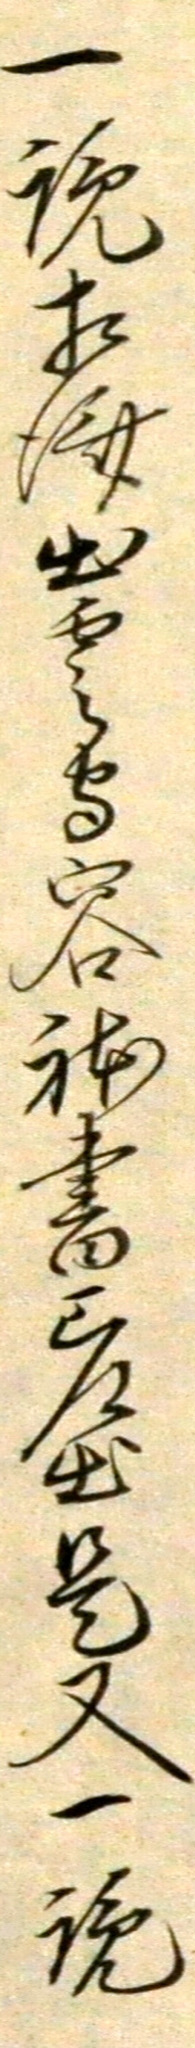一覧相済出雲守容躰書差出是又一覧
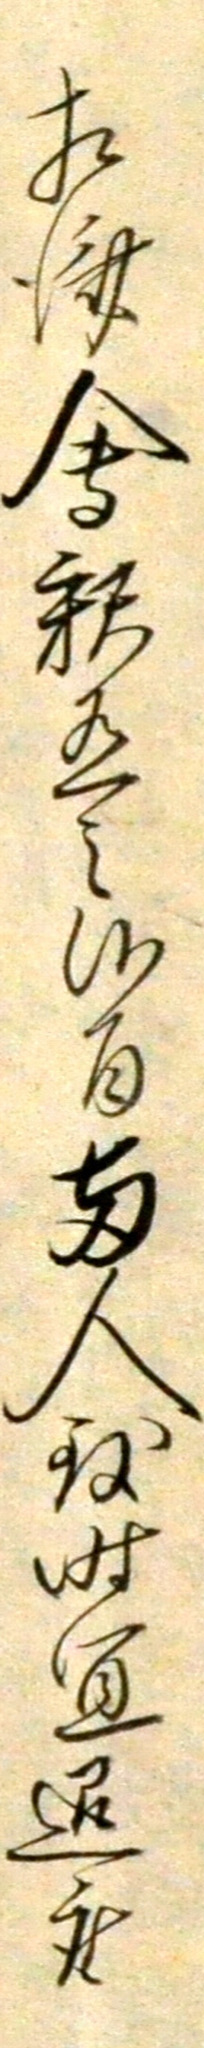相済会釈有之候間両人致時宜退座
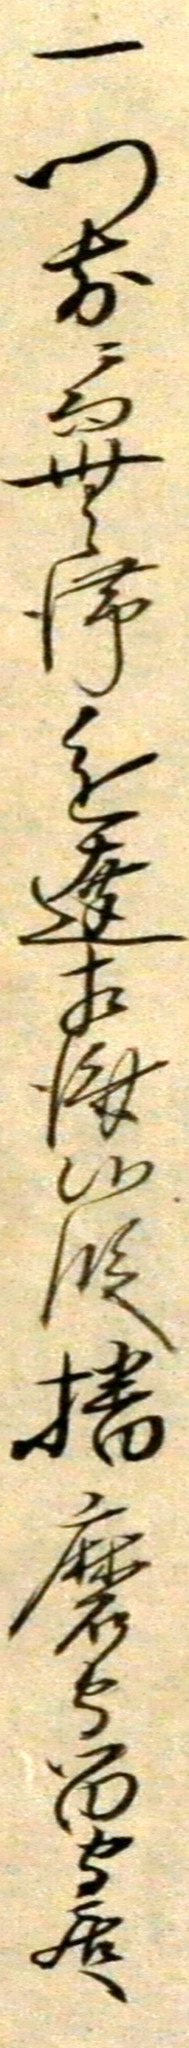一門前ニ而無滞進達相済候段播磨守留守居ヘ
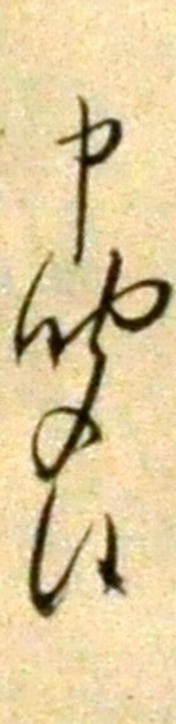申聞候

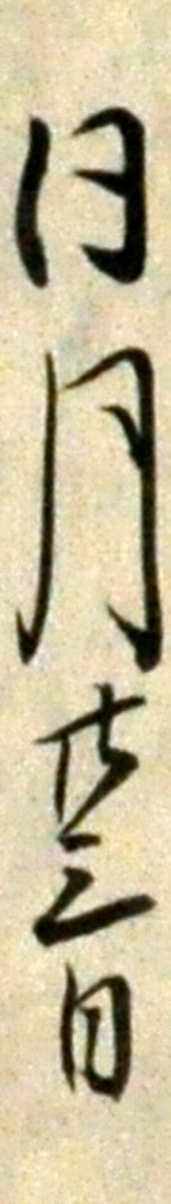同月廿三日
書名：諸名代相勤候節ノ留書外
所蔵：伊那市立高遠町図書館・合同会社AMANE
